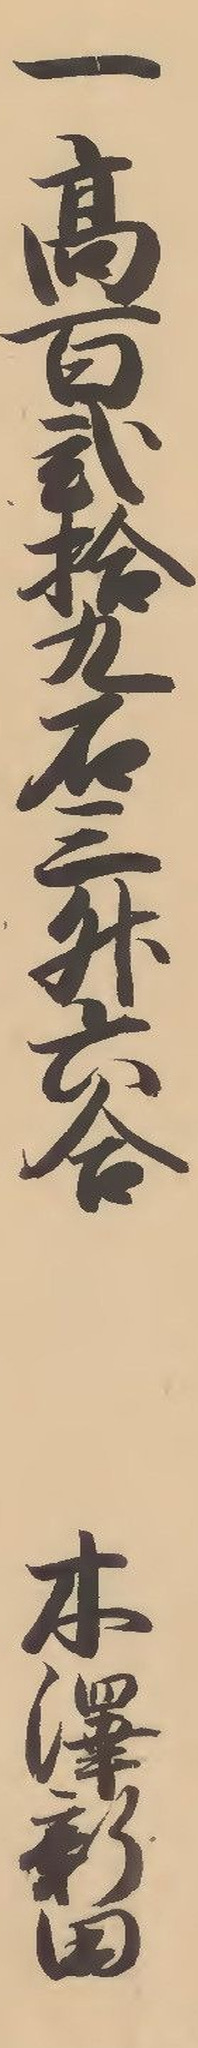一高百弐拾九石三升六合木沢新田

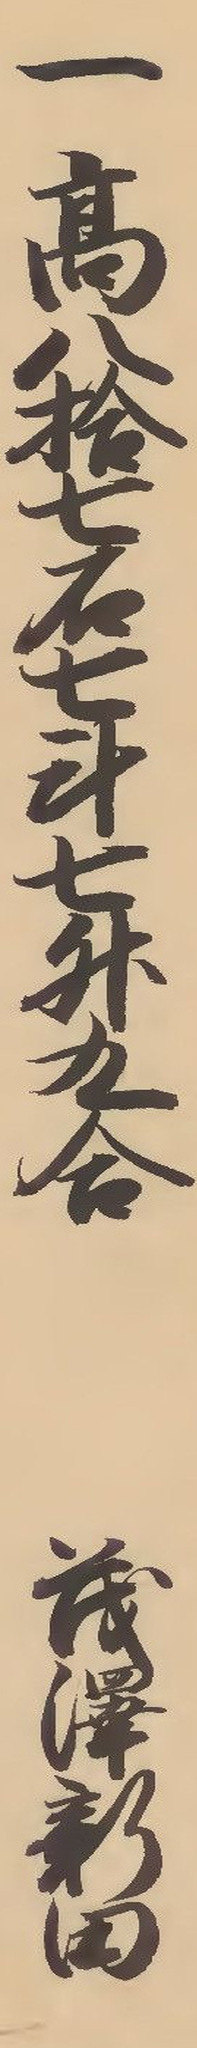一高八拾七石七斗七升九合茂沢新田
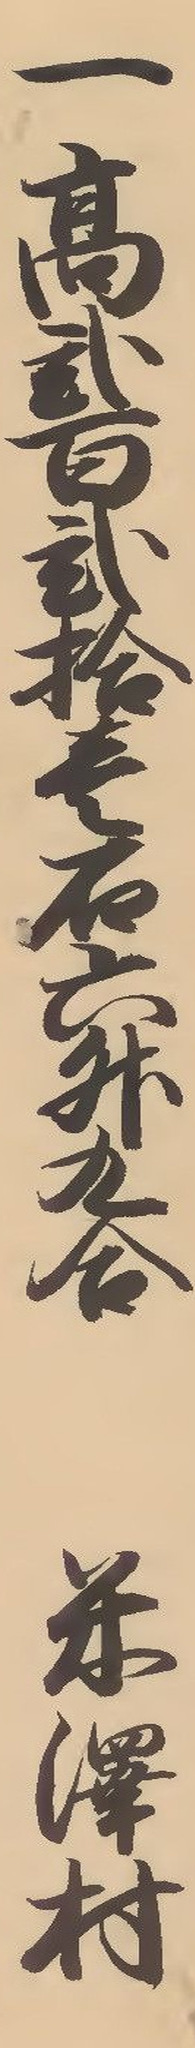一高弐百弐拾壱石六升九合米沢村
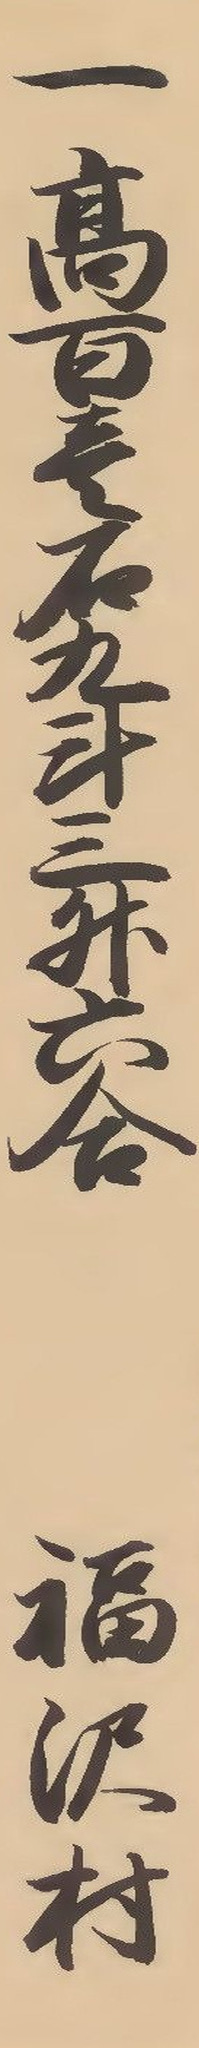一高百壱石九斗三升六合福沢村
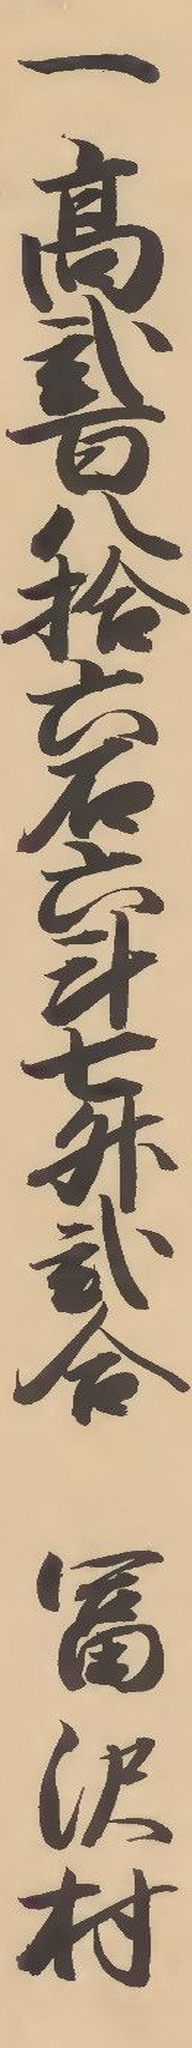一高弐百八拾六石六斗七升弐合富沢村
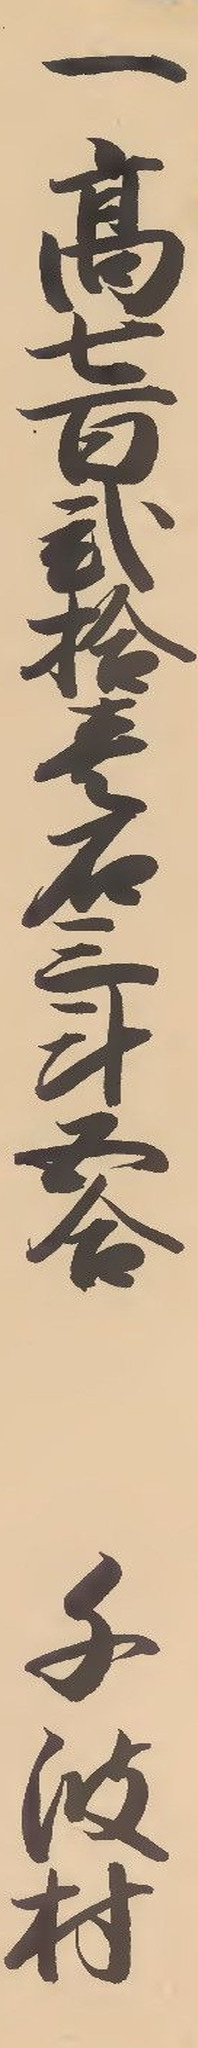一高七百弐拾壱石三斗五合千波村
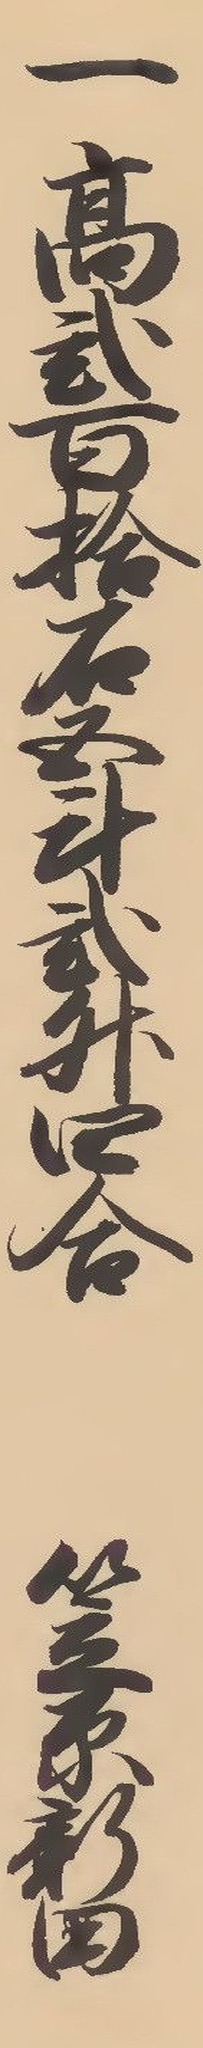一高弐百拾石五斗弐升四合笠原新田
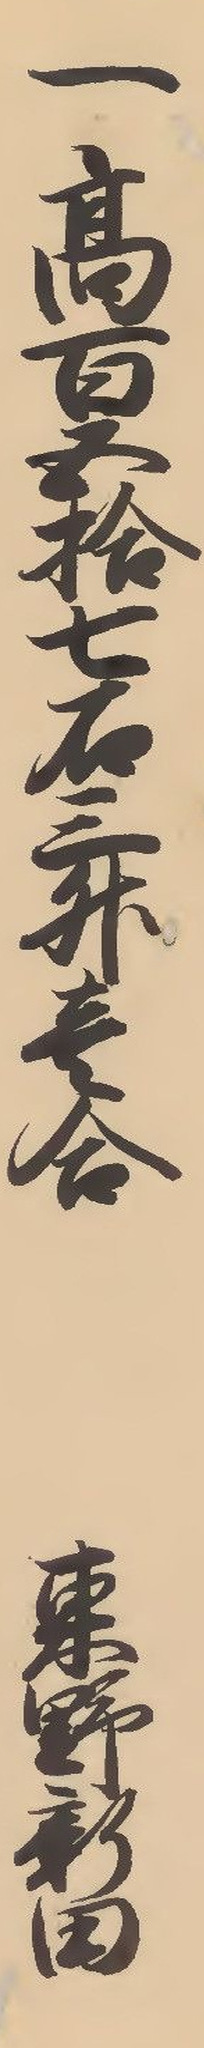一高百五拾七石三升壱合東野新田
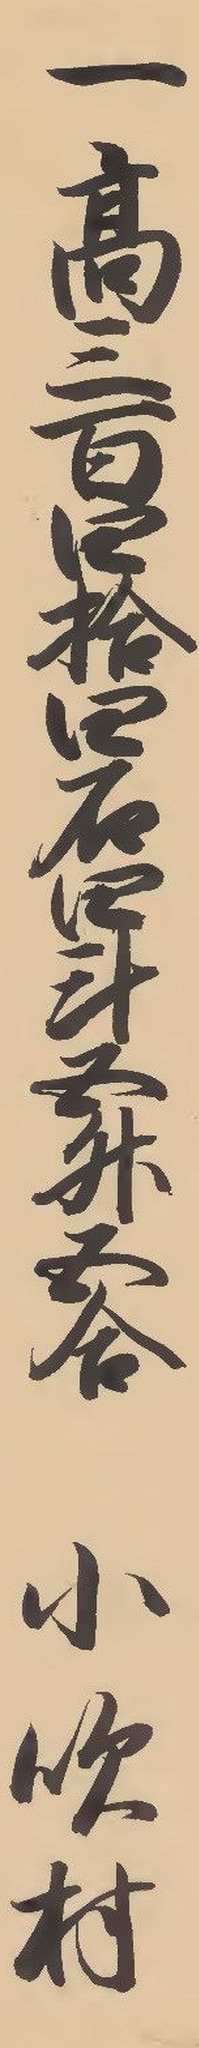一高三百四拾四石四斗五升五合小吹村

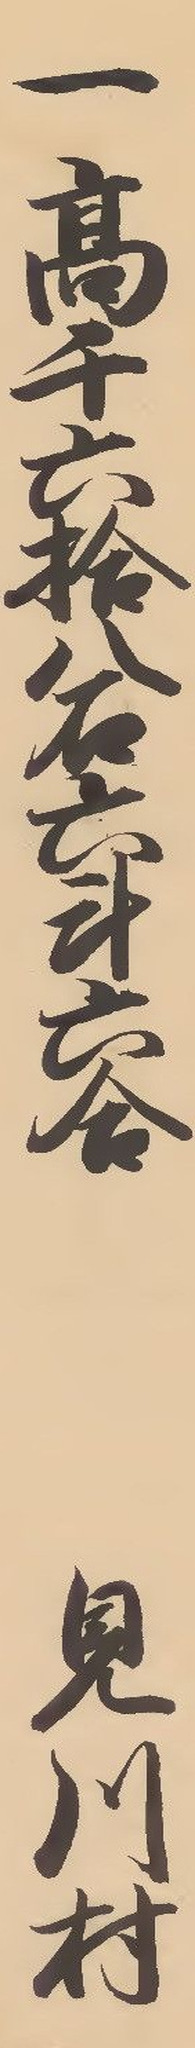一高千六拾八石六斗六合見川村
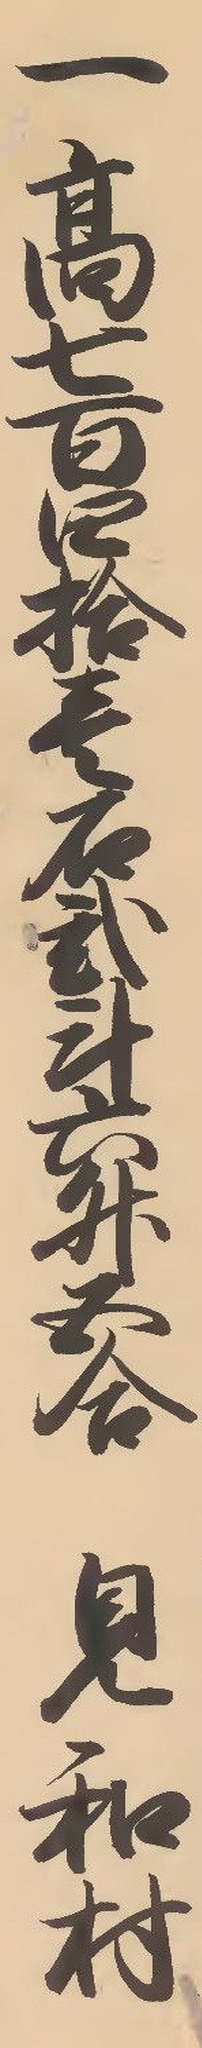一高七百四拾壱石弐斗六升五合見和村
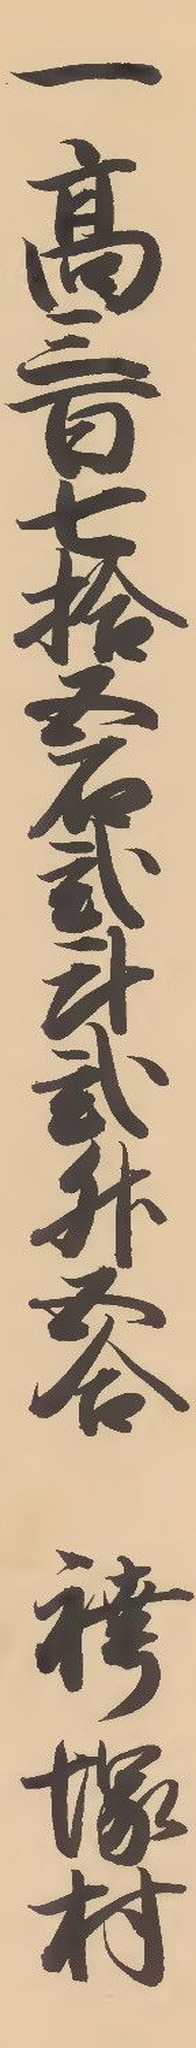一高三百七拾五石弐斗弐升五合袴塚村
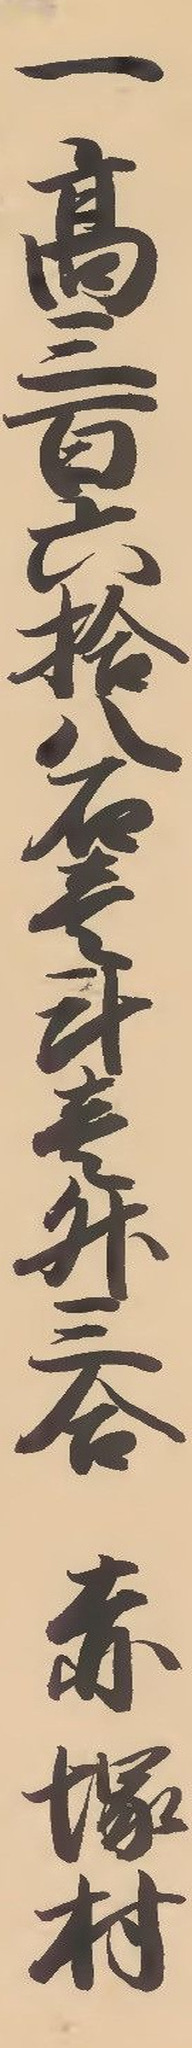一高三百六拾八石壱斗壱升三合赤塚村
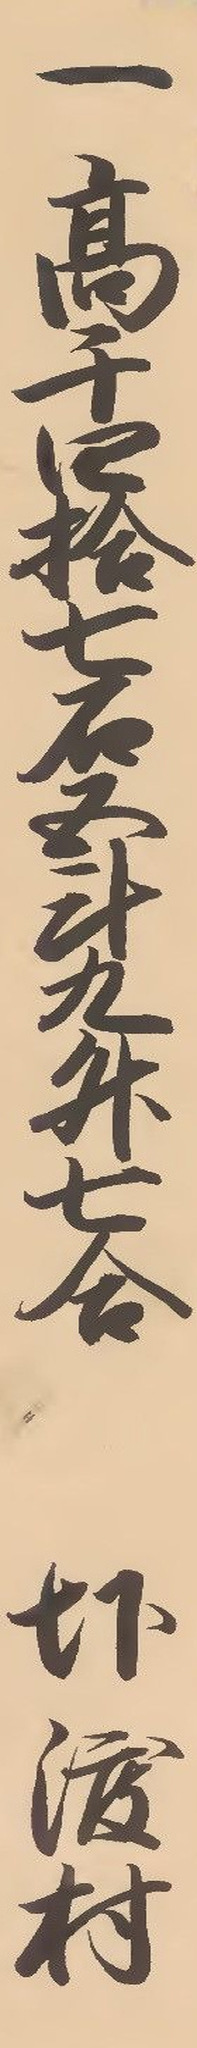一高千四拾七石五斗九升七合圷渡村
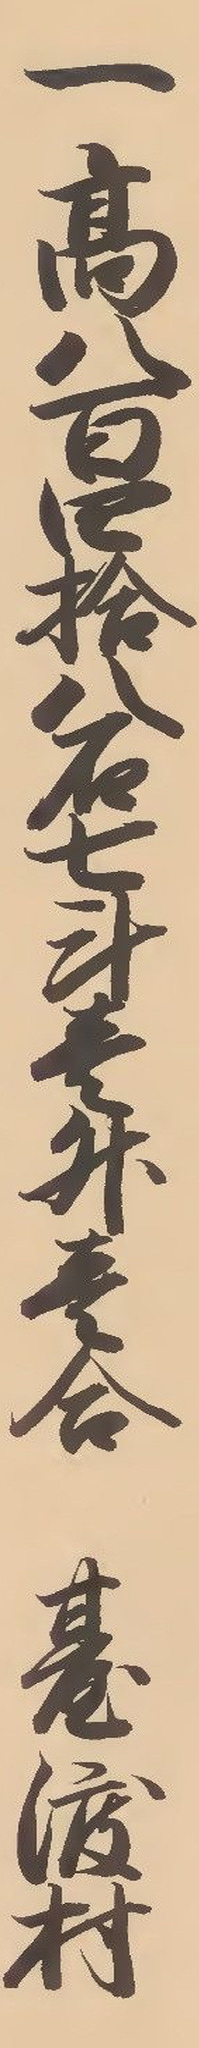一高八百四拾八石七斗壱升壱合台渡村
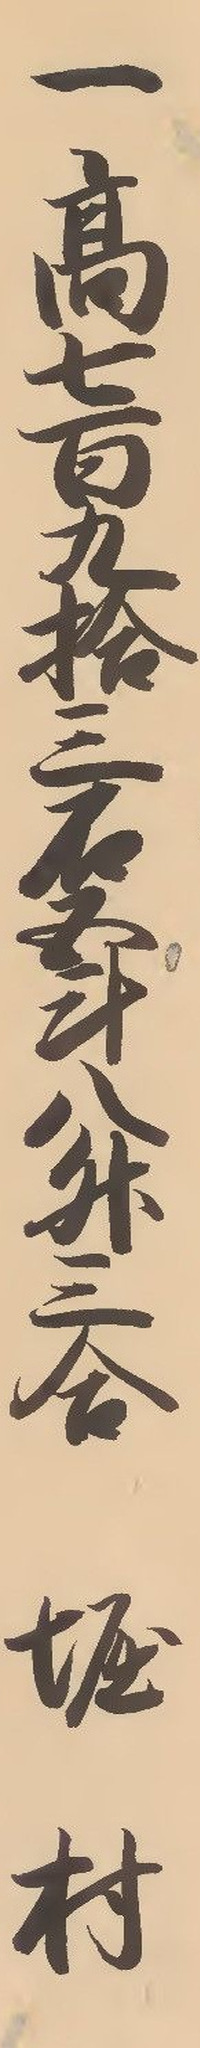一高七百九拾三石五斗八升三合堀村
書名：常陸国郷帳
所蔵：国立公文書館 National Archives of Japan
